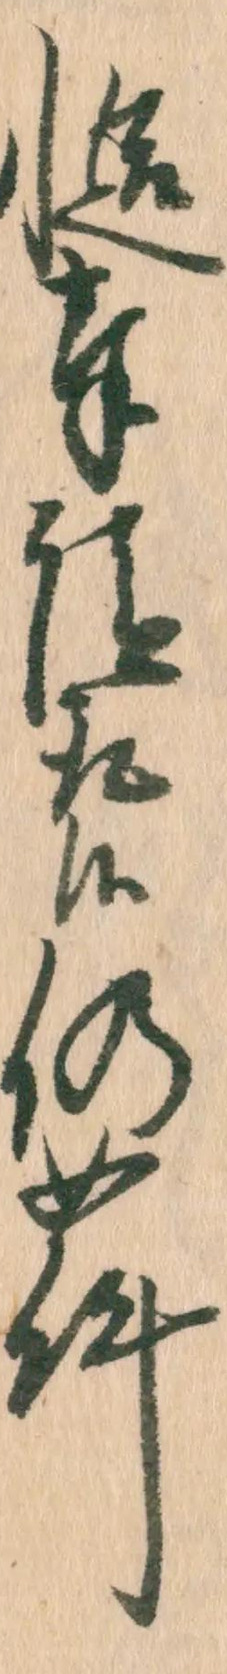慥奉請取候仍如件
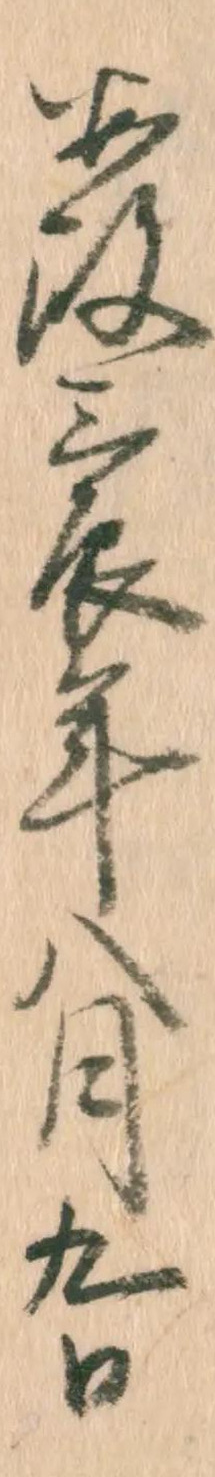安政三辰年八月九日右
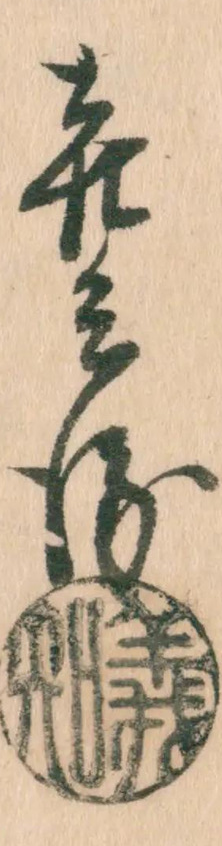喜兵衛㊞
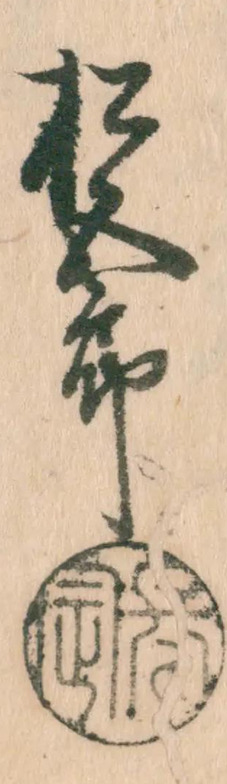松五郎㊞

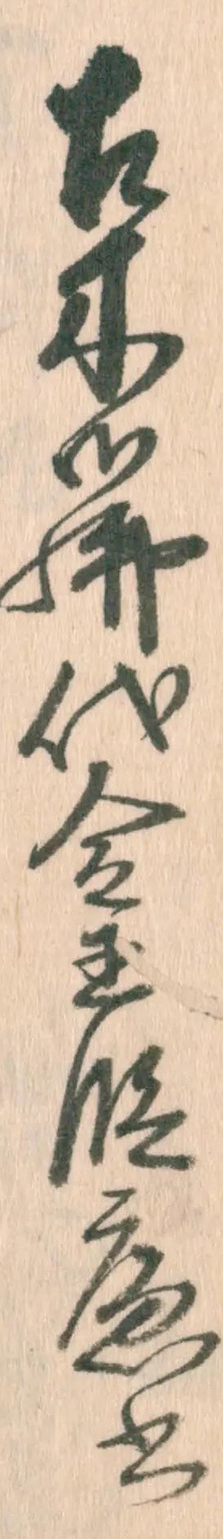古木御払代金直段慮書
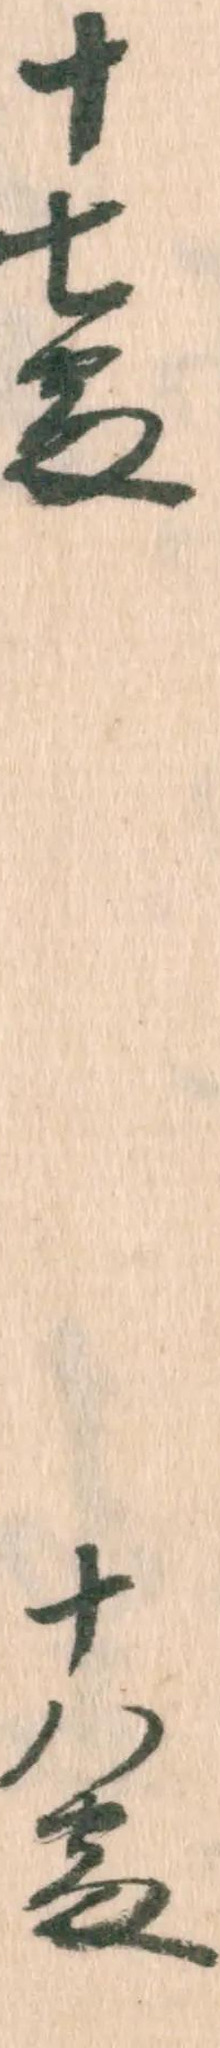十七両十八両
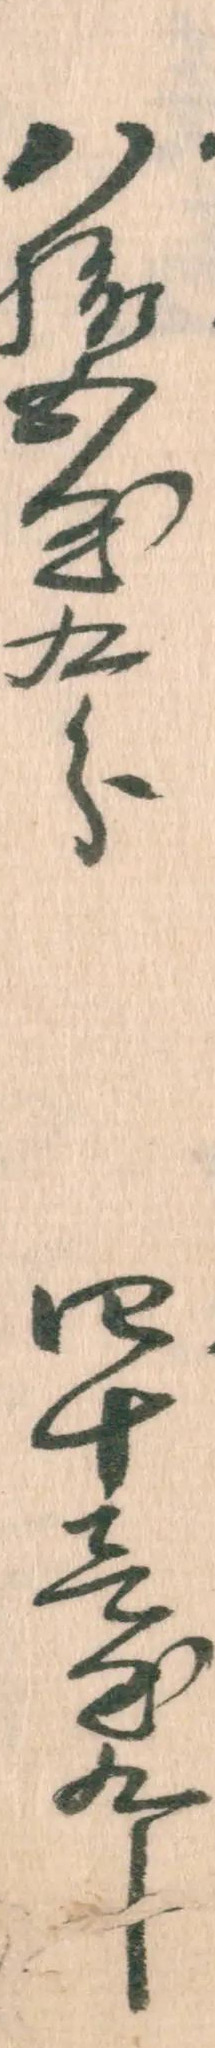八拾五匁九分四十壱匁九分
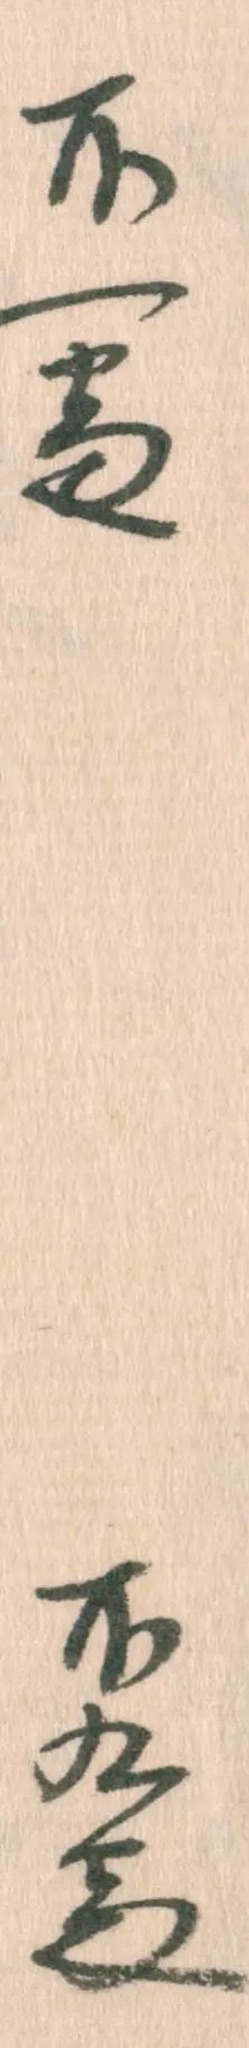廿一両廿九両
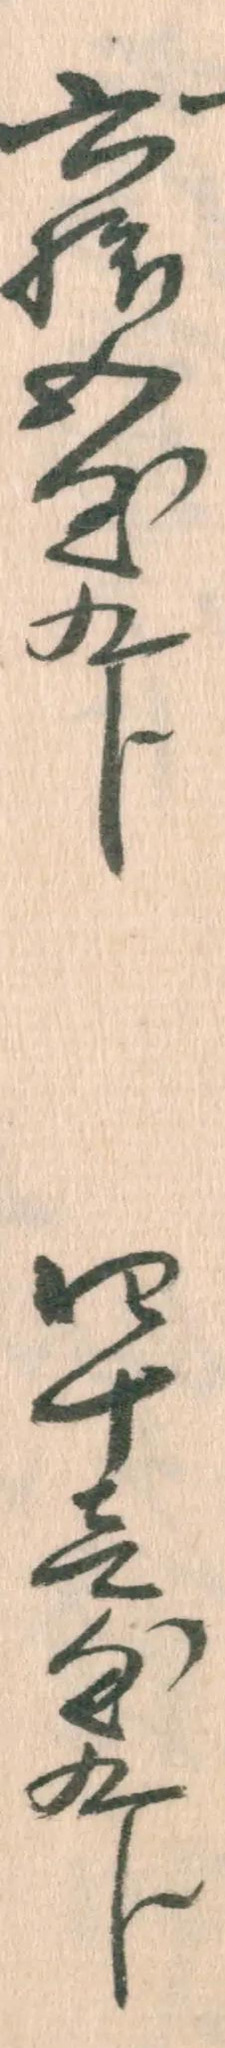六拾五匁九分四十壱匁九分
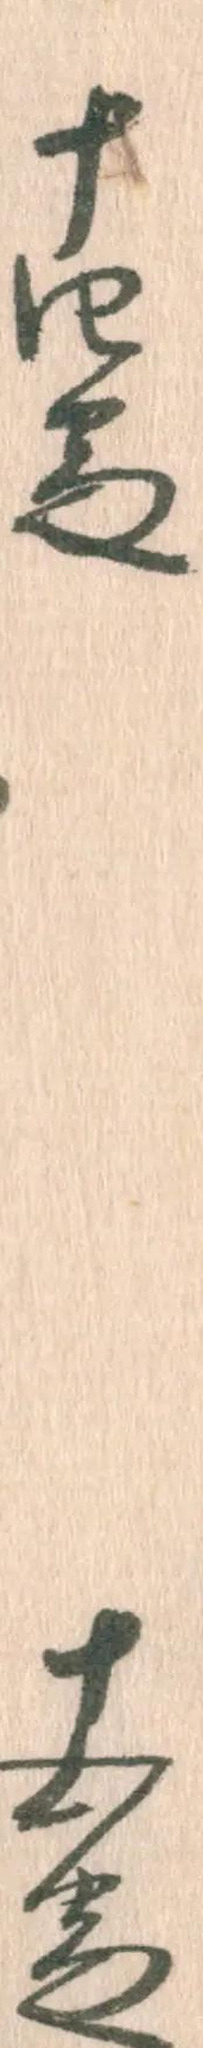十四両十五両

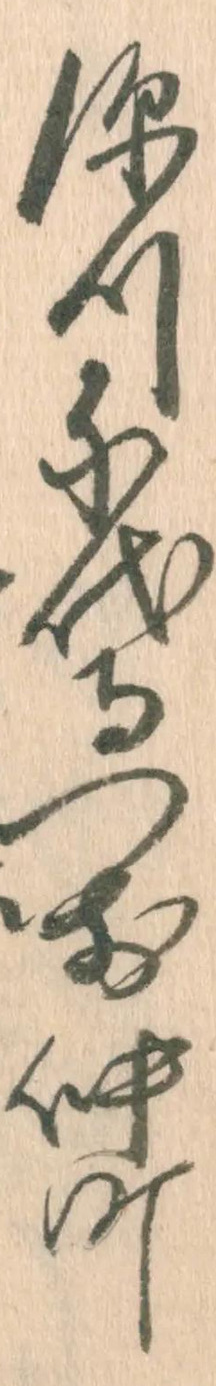深川永代寺門前仲町
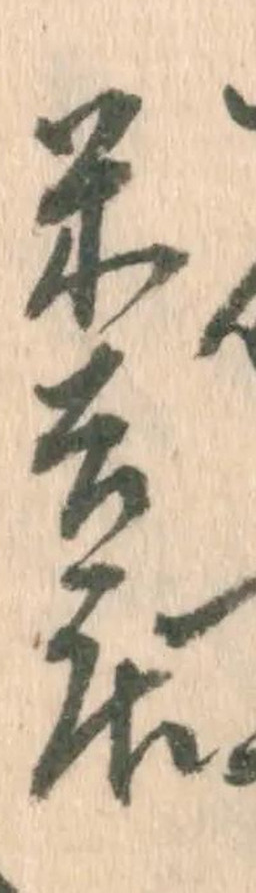米吉店
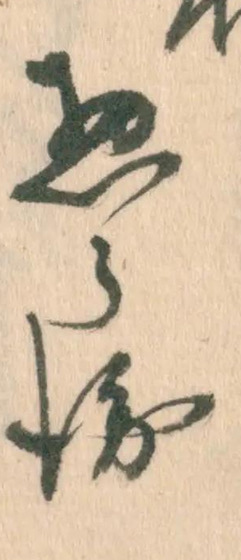惣兵衛
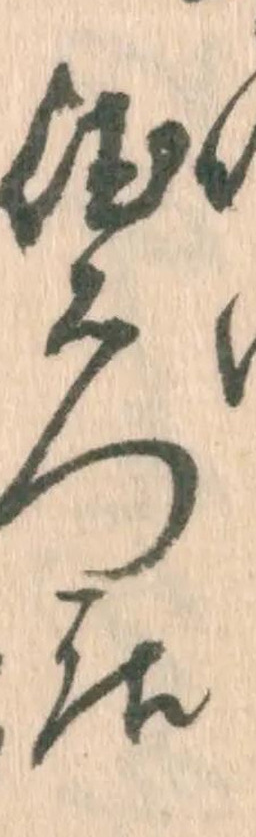徳右衛門店
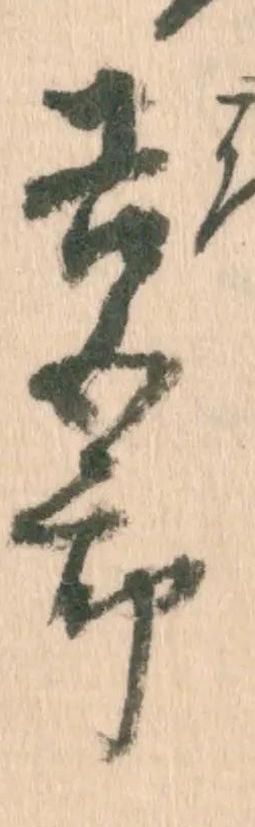吉五郎
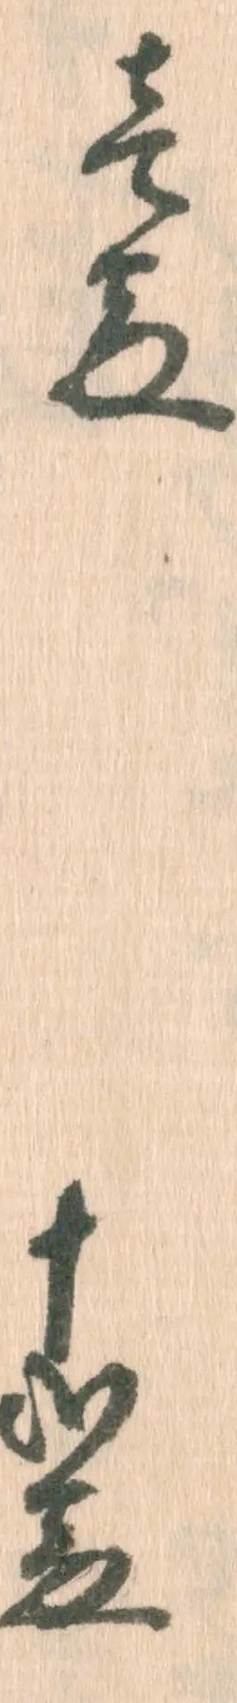壱両十弐両
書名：三十三間堂. [2]
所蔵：国立国会図書館 National Diet Library, JAPAN
